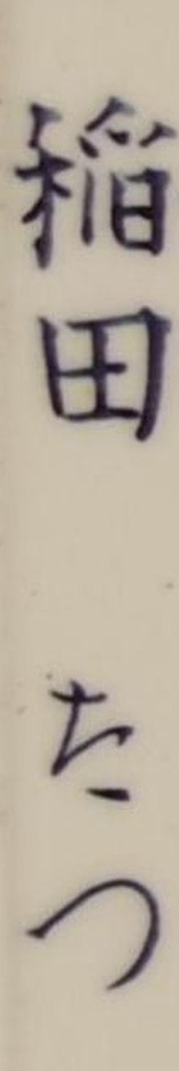稲田たつ

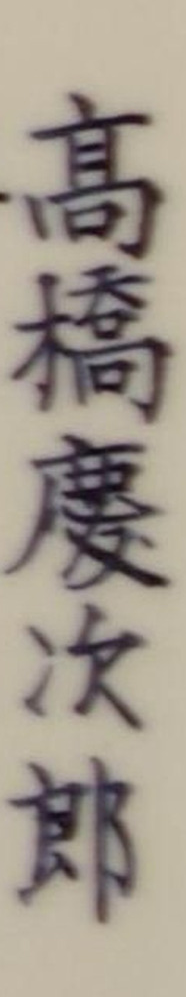高橋慶次郎
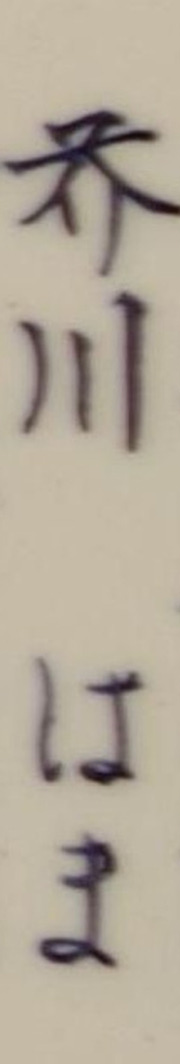芥川はま
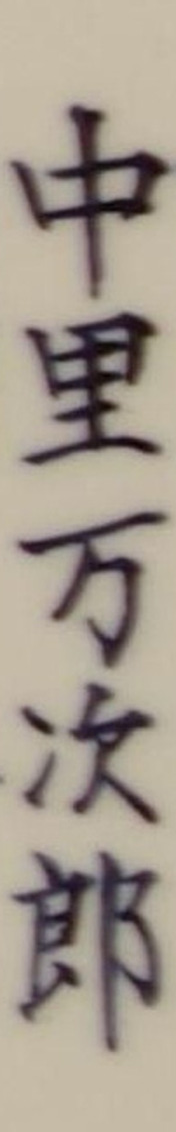中里万次郎
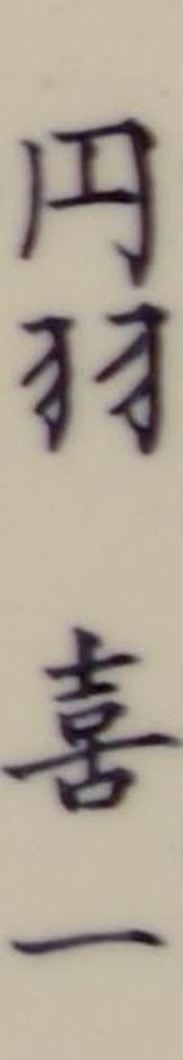丹羽喜一
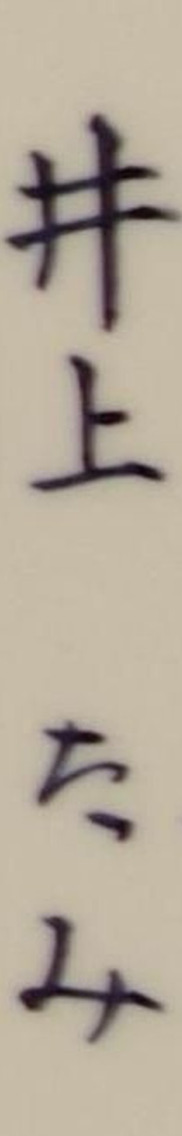井上たみ
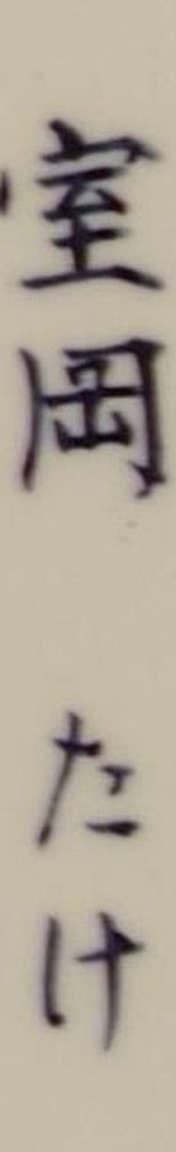室岡たけ
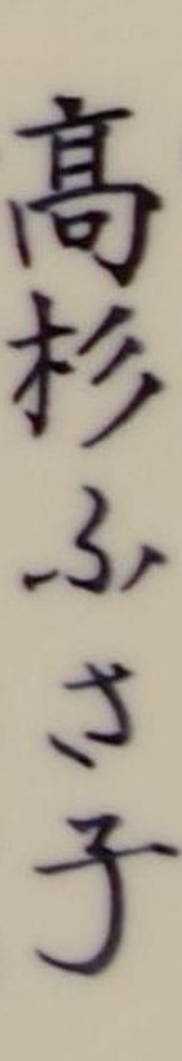高杉ふさ子
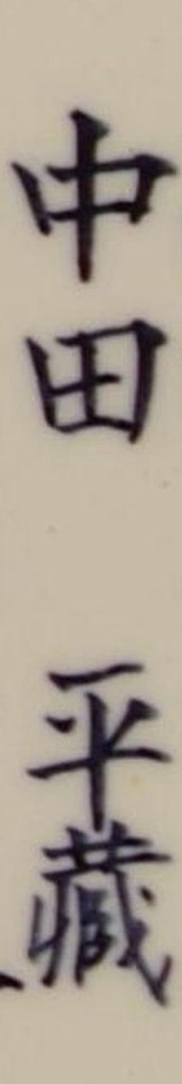中田平蔵
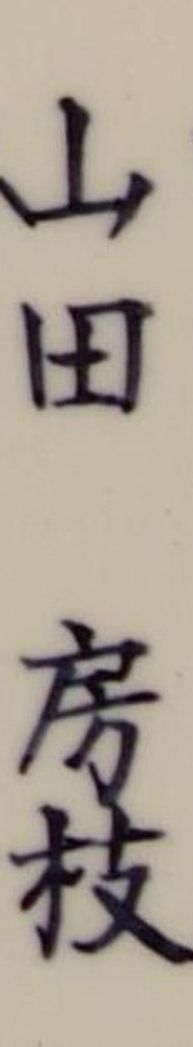山田房枝
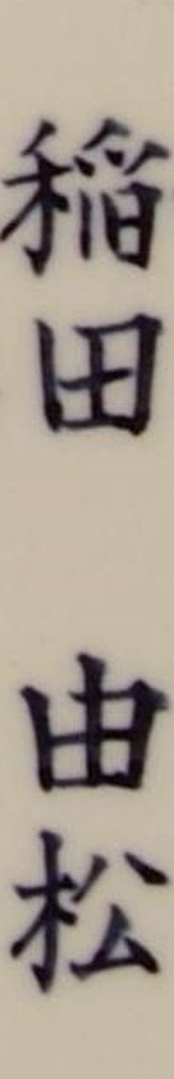稲田由松
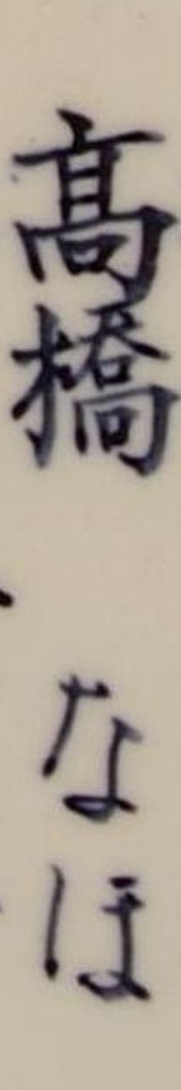高橋なほ
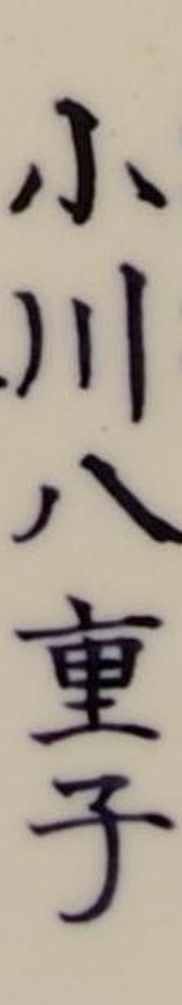小川八重子
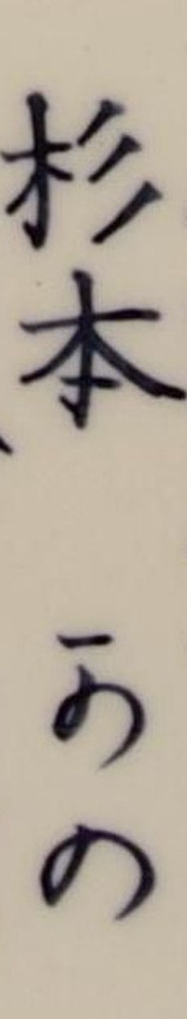杉本かの
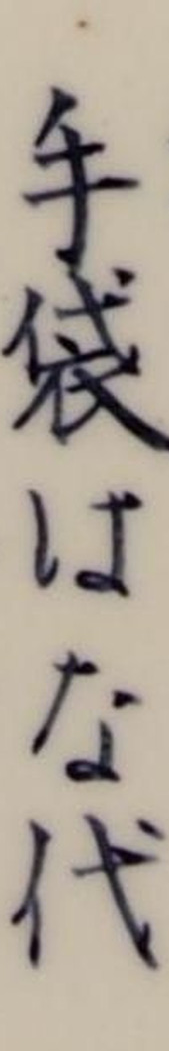手袋はな代
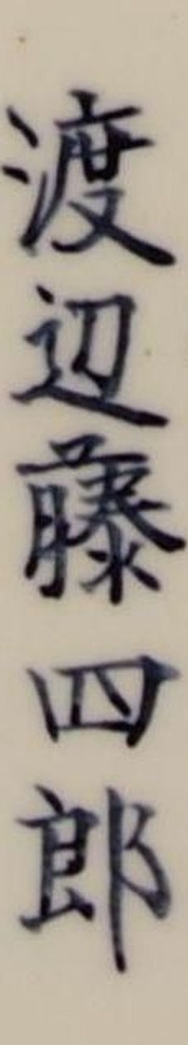渡辺藤四郎
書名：E~L
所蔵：高野山金剛峯寺
